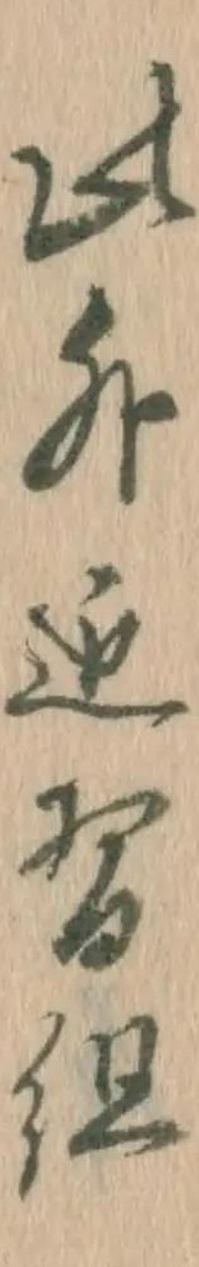此外近習組
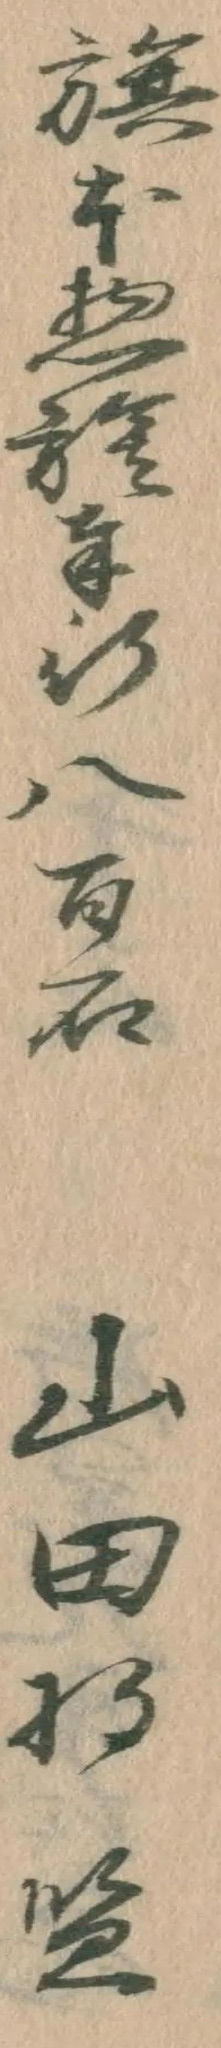旗本惣旗奉行八百石山田将監
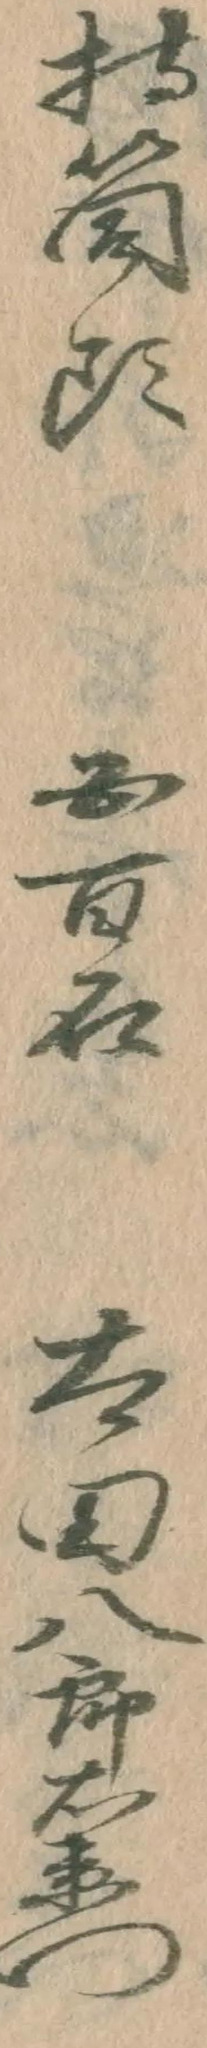持筒頭五百石太田八郎右衛門
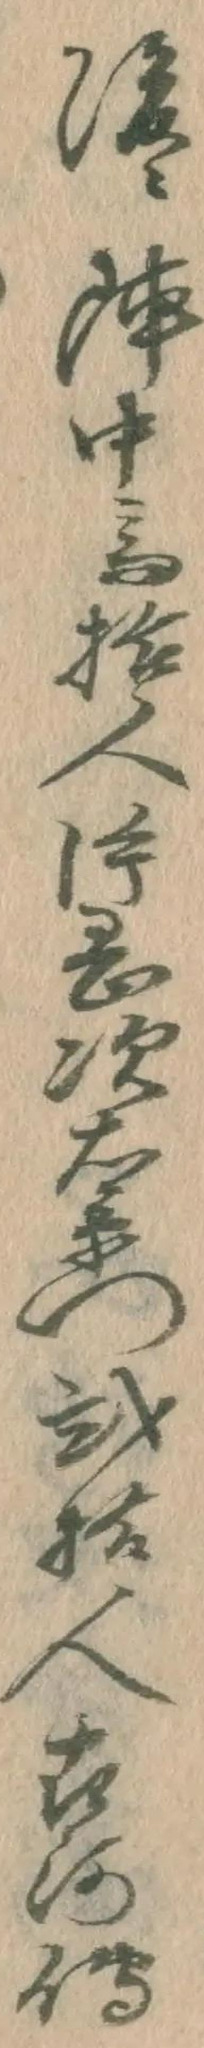後に陣中に而拾人片岡次右衛門弐拾人古河伝
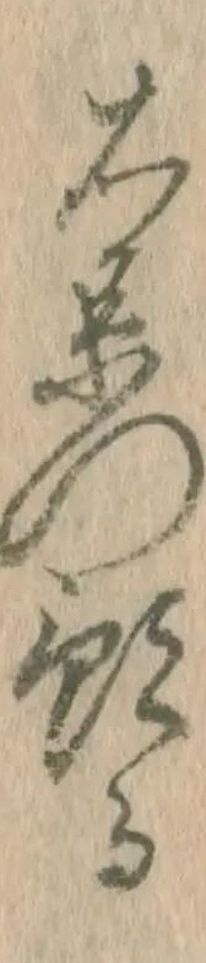右衛門預る
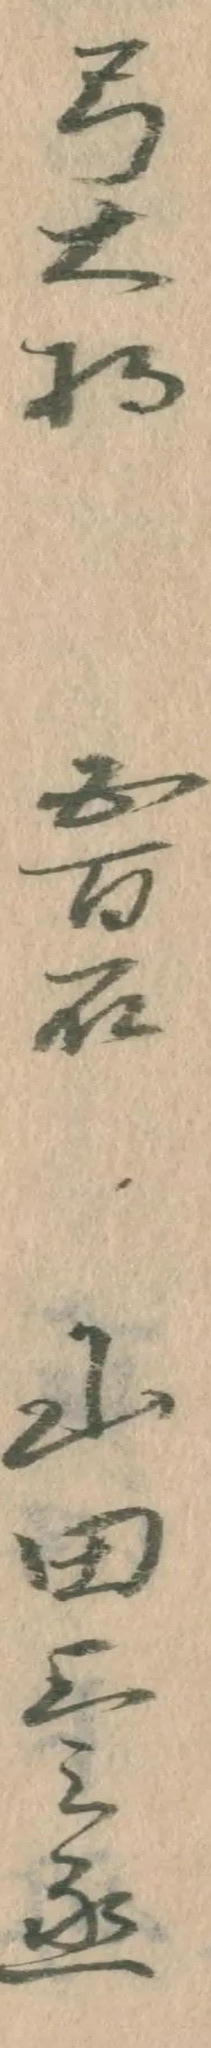弓大将五百石山田三之丞
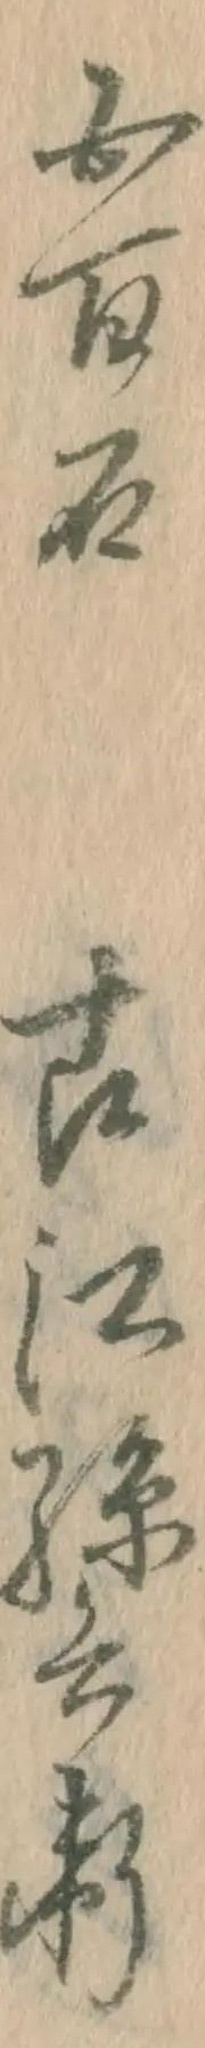五百石古江孫兵衛
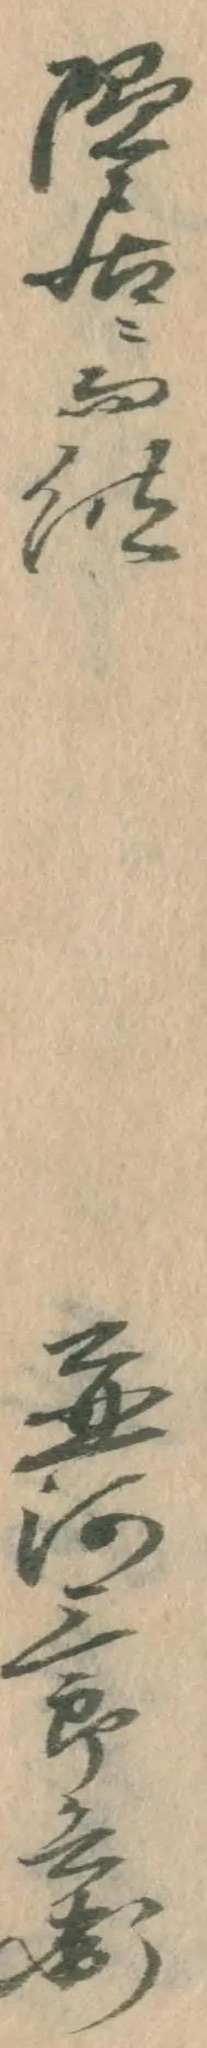隠居に而供並河三郎兵衛

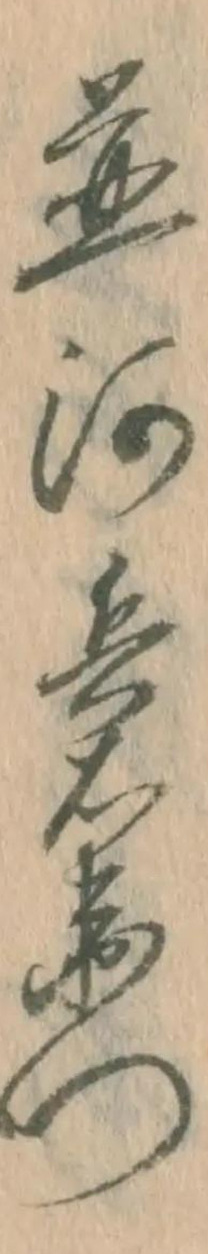並河兵右衛門
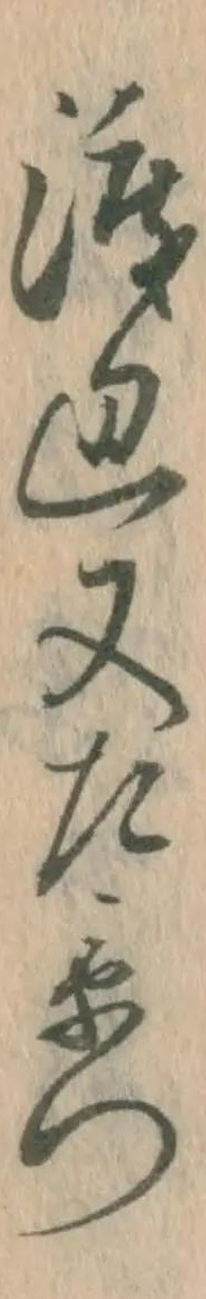渡辺又左衛門
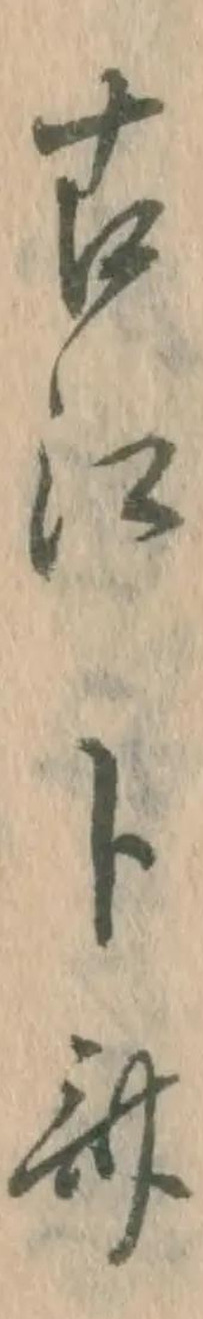古江ト斎
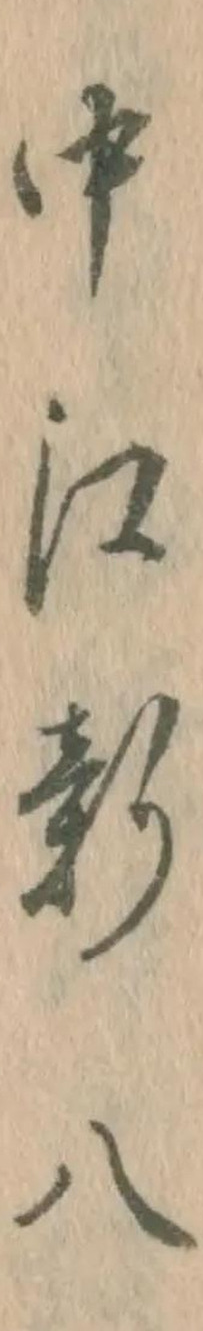中江新八
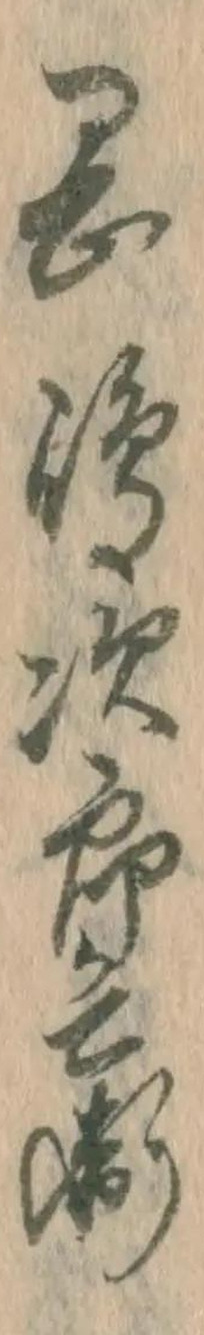岡島次郎兵衛
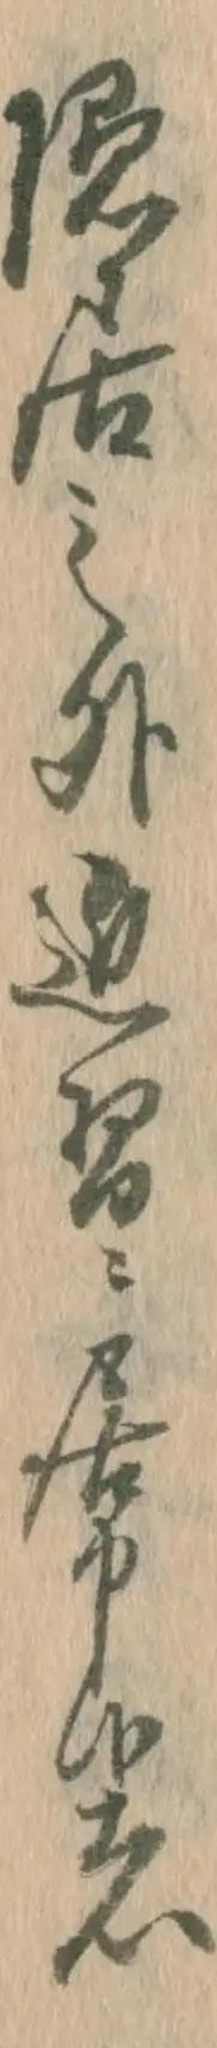隠居之外近習に居申候者
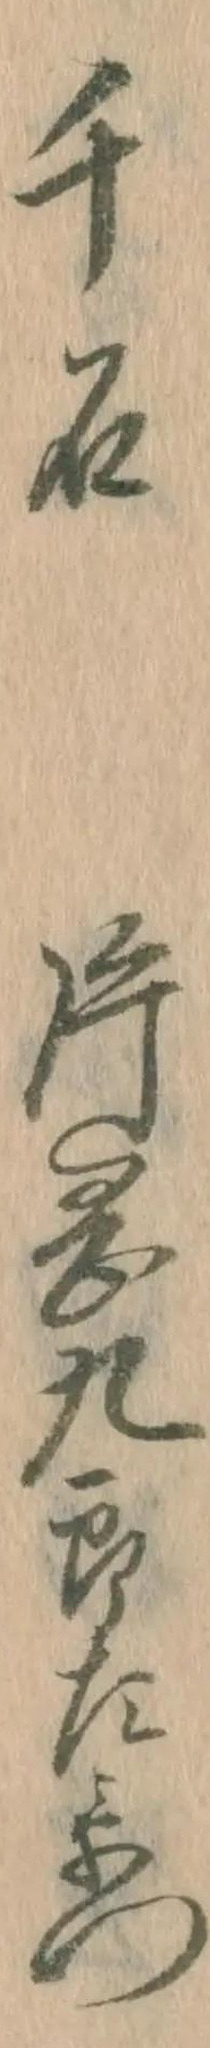千石片岡九郎左衛門
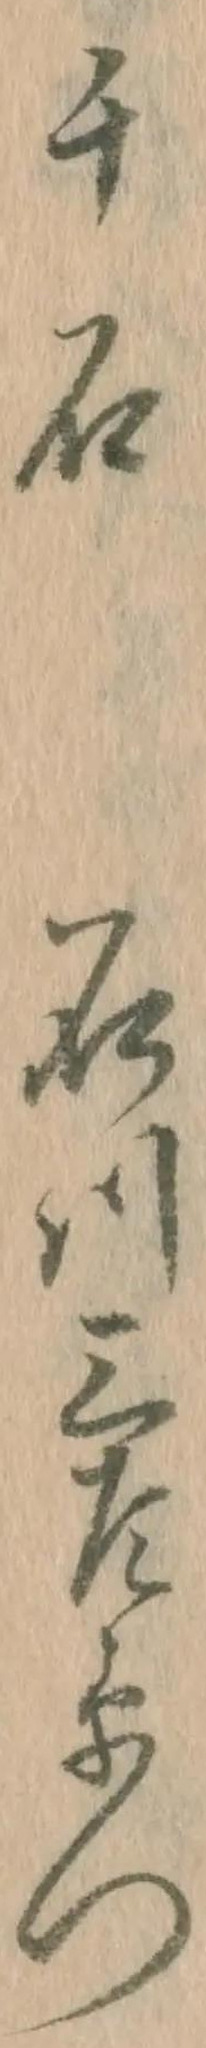千石石川三左衛門
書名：切支丹御退治記 49巻. [5]
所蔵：国立国会図書館 National Diet Library, JAPAN
